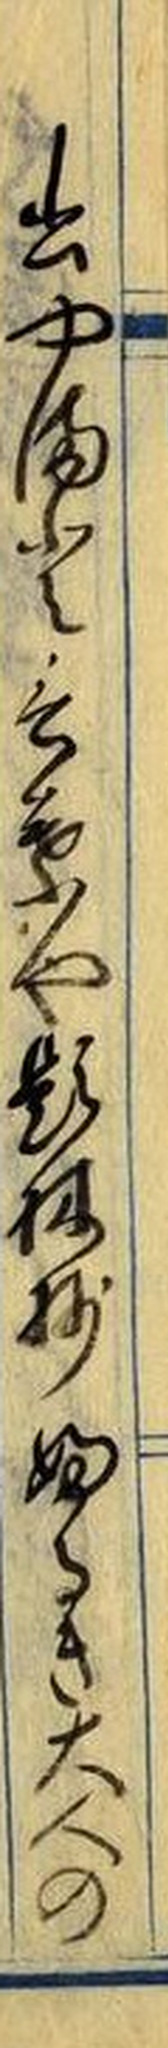書やまと言葉や題林抄ふるき大人の
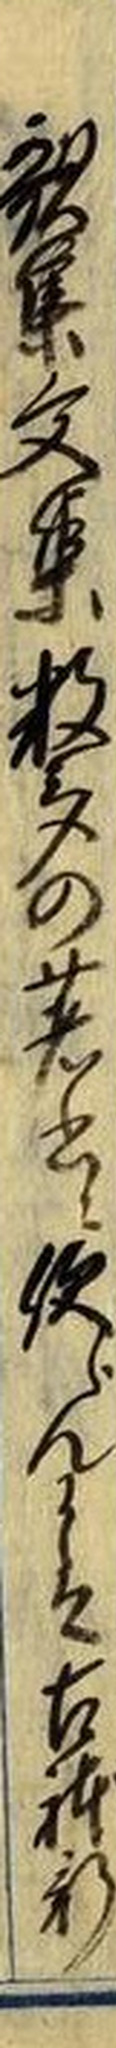歌集文集数多の著書便らんには古体新
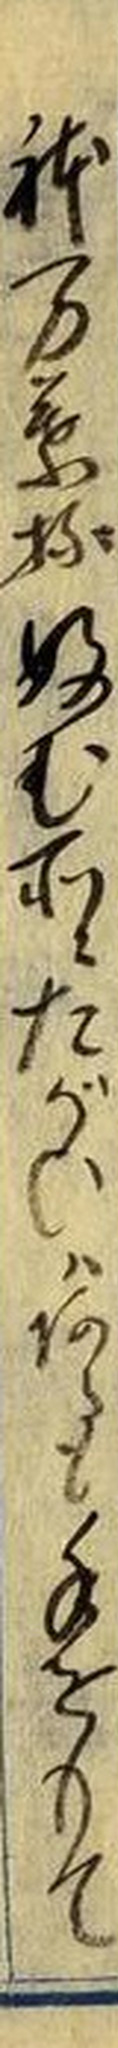体万葉集抔好む所ニたがひハあるも手をもて
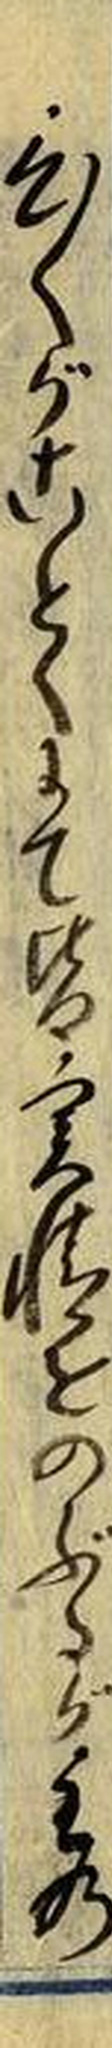ひくがことくにて皆実情をのぶるが主の
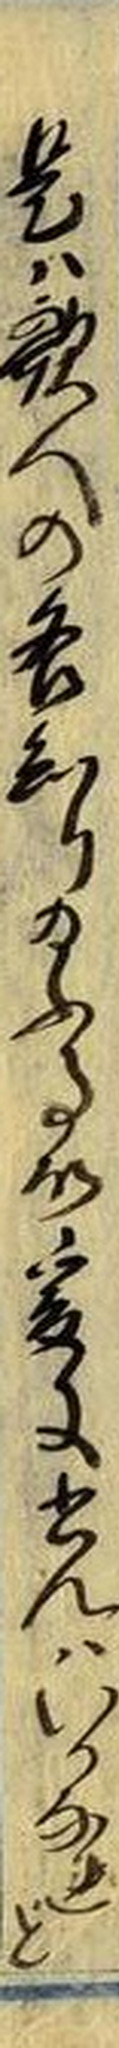是ハ歌人の各知り給ふ事故爰に書んハいかなれど
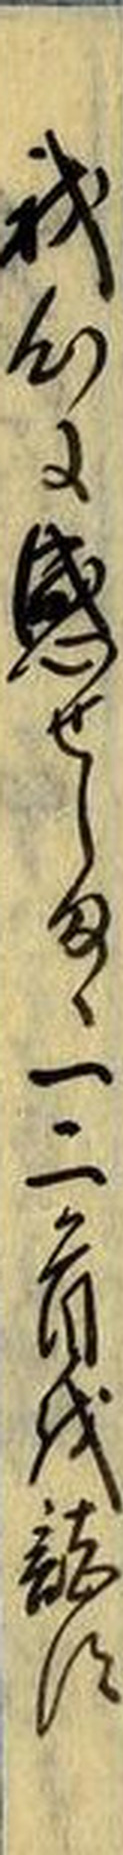我心に感せしゆへ一二首を誌す
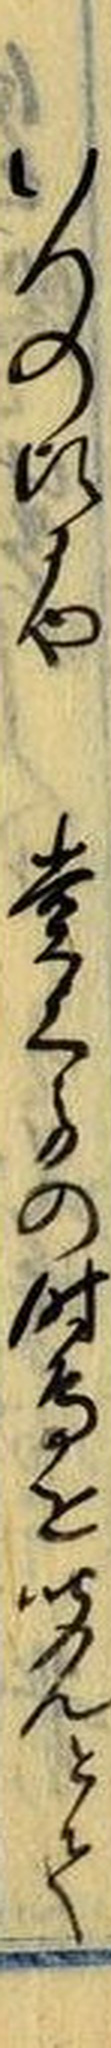いつの頃にや堂上方の時鳥を聞んとて
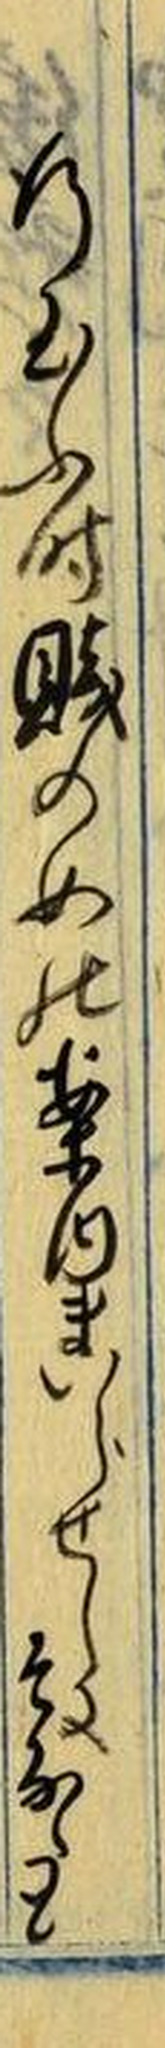行玉ふ時賊の如の案内まいらせしにそなたも
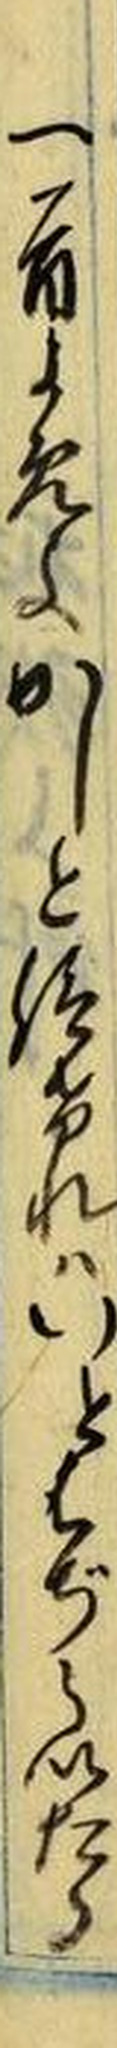一首よめよかしと給けれハいとはぢらいたる
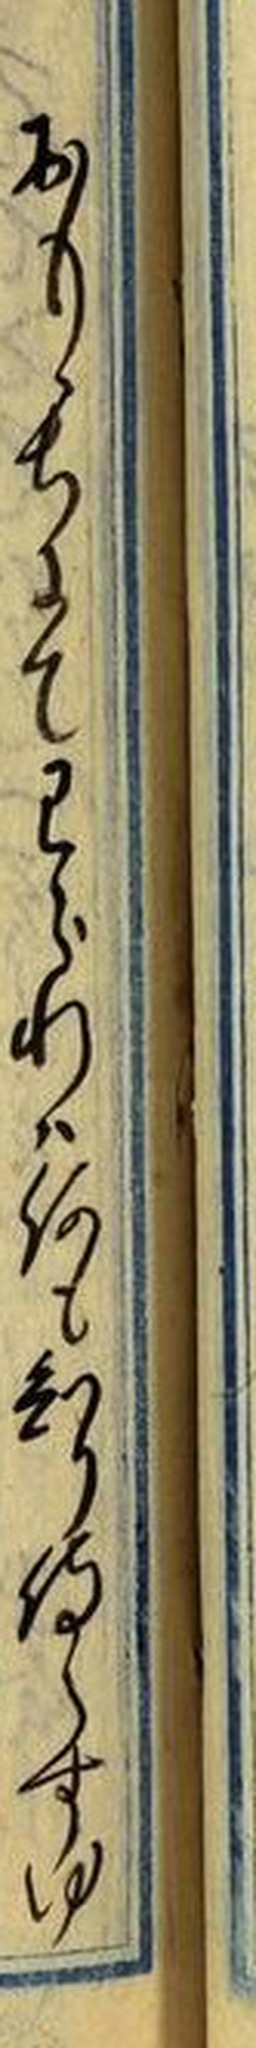おもゝちにてわらわハ何も知り侍らすゆ
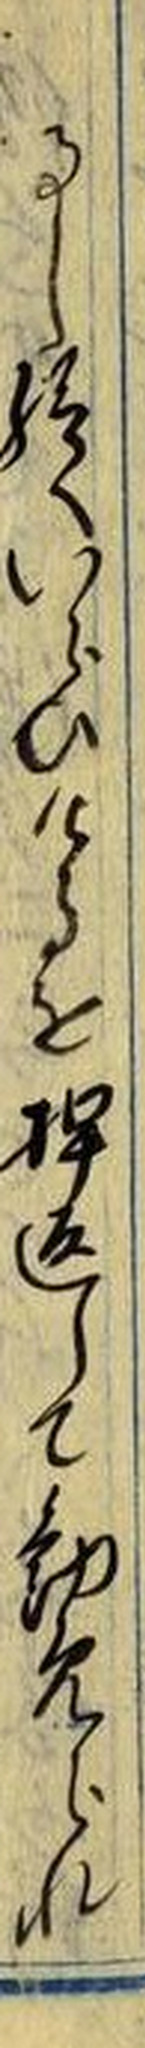るし給へいらひけるを押返して勧められ
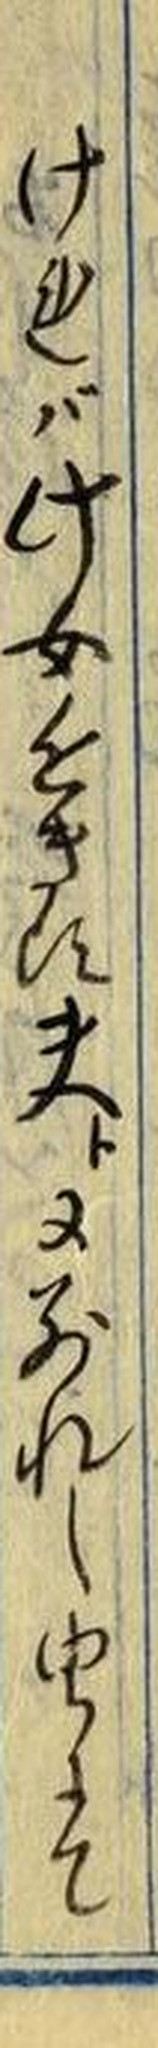けれバ此女近き頃夫トに別れし由にて
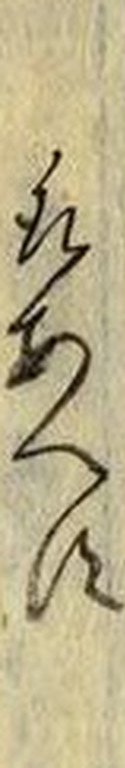取あへす
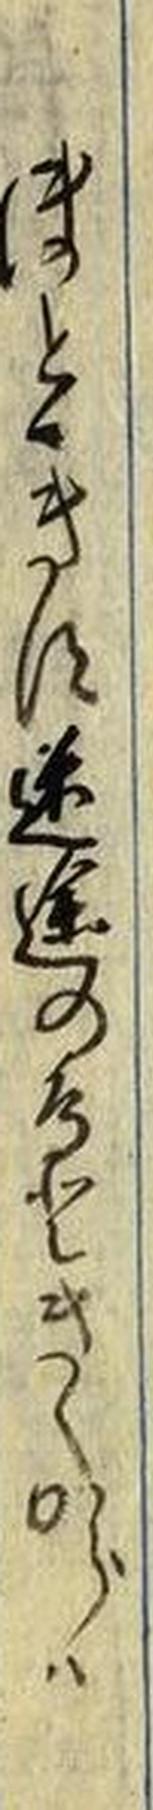ほとゝきす迷途の鳥ときくからハ
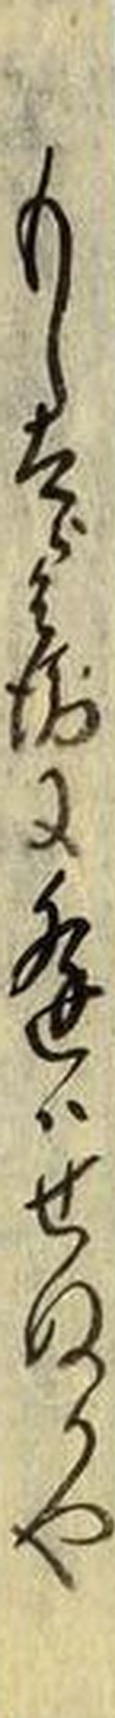もし太郎兵衛に逢ハせぬかや
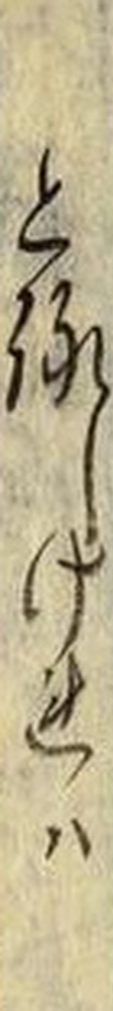と詠しけれハ
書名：温古集 三巻
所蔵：福井県文書館 Fukui Prefectural Archives
